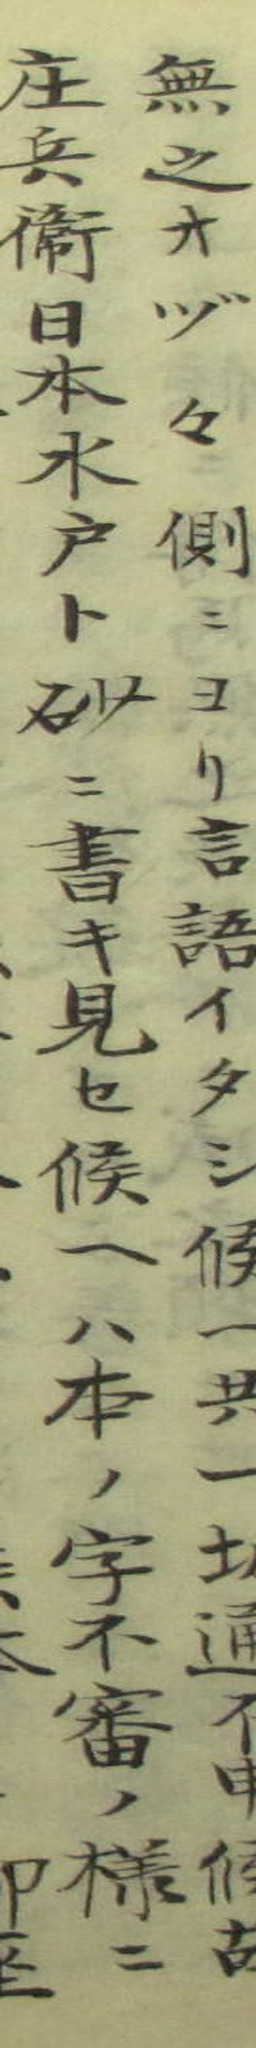庄兵衛日本水戸ト砂ニ書キ見セ候ヘハ本ノ字不審ノ様ニ
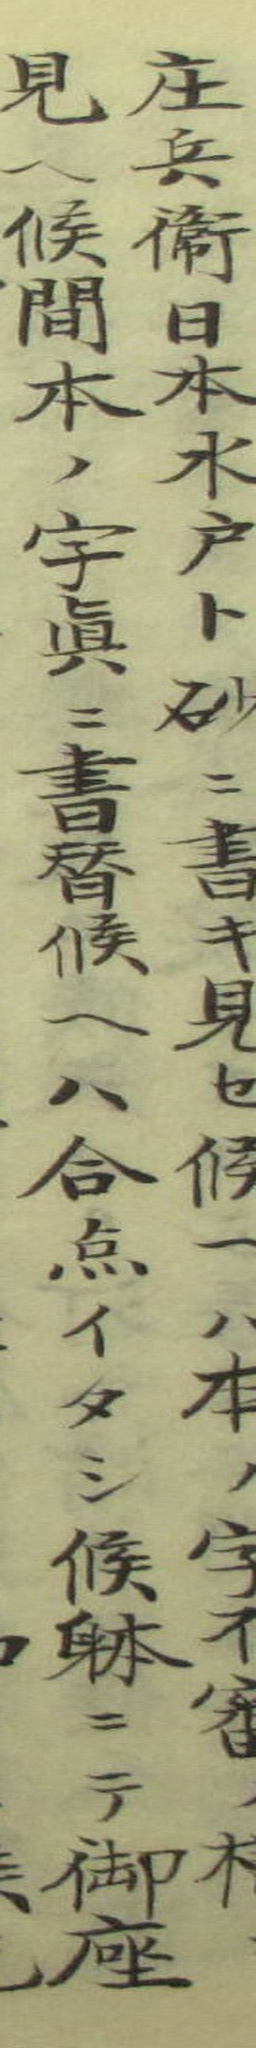見ヘ候間本ノ字真ニ書替候ヘハ合点イタシ候躰ニテ御座
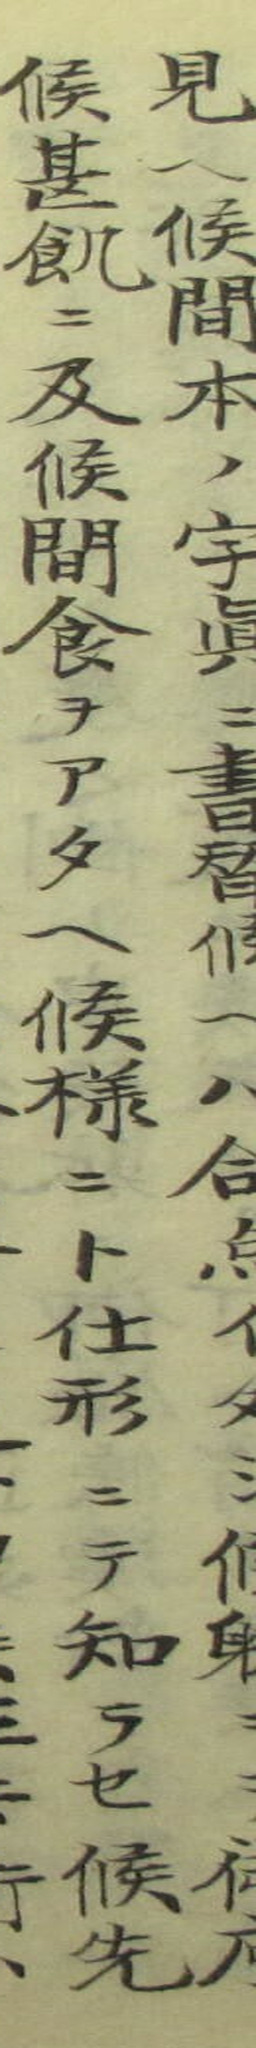候甚飢ニ及候間食ヲアタへ候様ニト仕形ニテ知ラセ候先
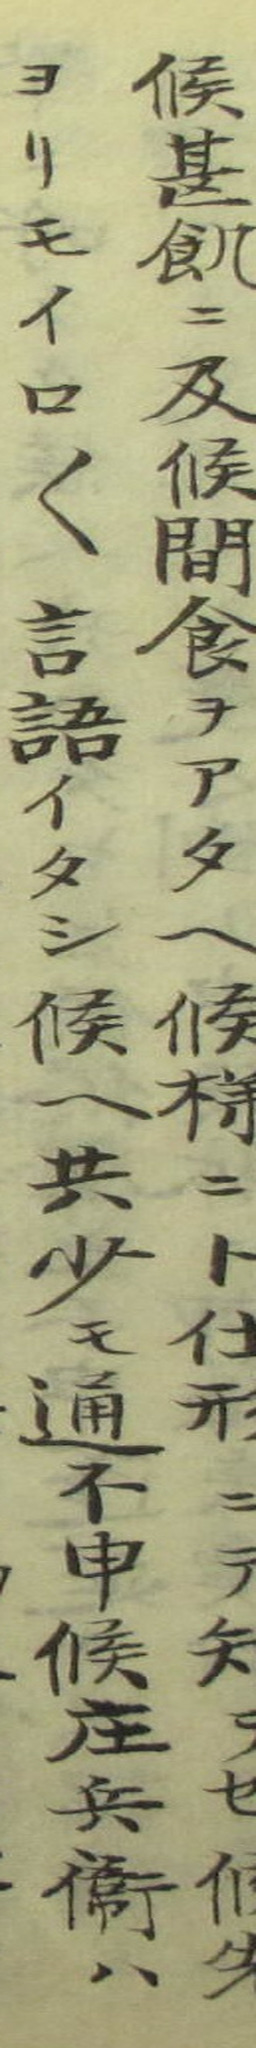ヨリモイロ〳〵言語イタシ候ヘ共少モ通不申候庄兵衛ハ
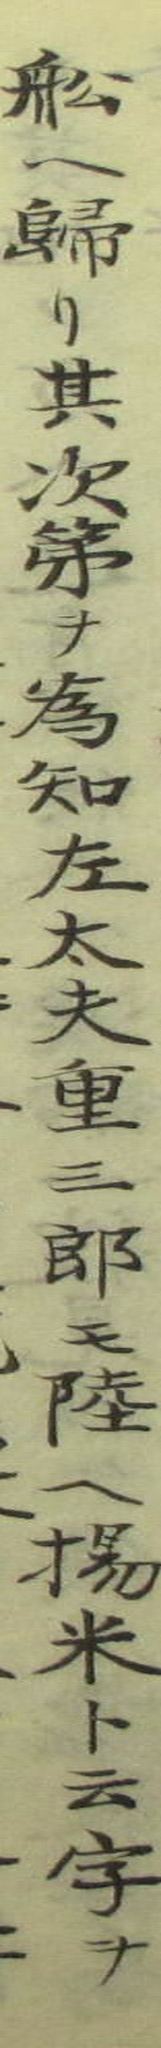舩へ帰リ其次第ヲ為知左太夫重三郎モ陸ヘ揚米ト云字ヲ
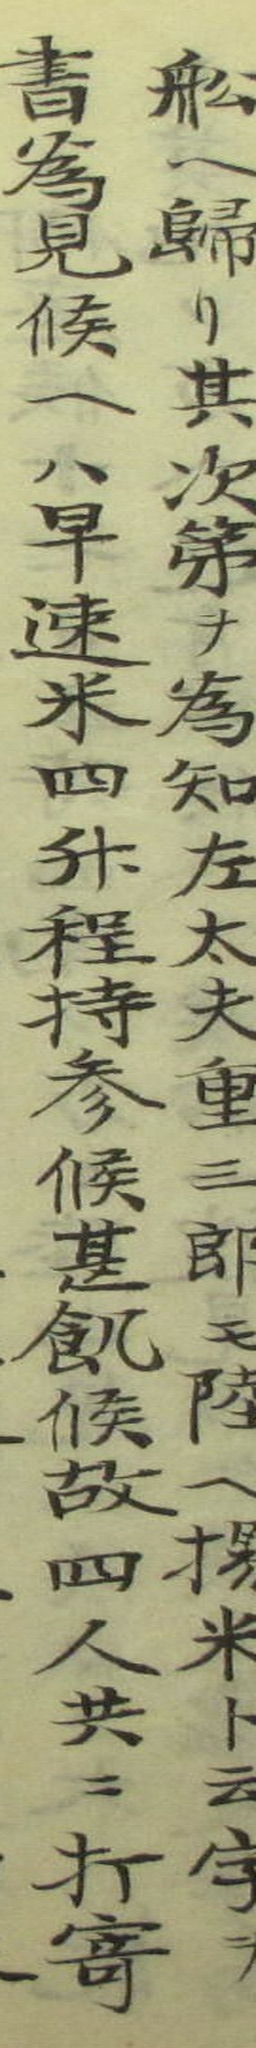書為見候ヘハ早速米四升程持参候甚飢候故四人共ニ打寄
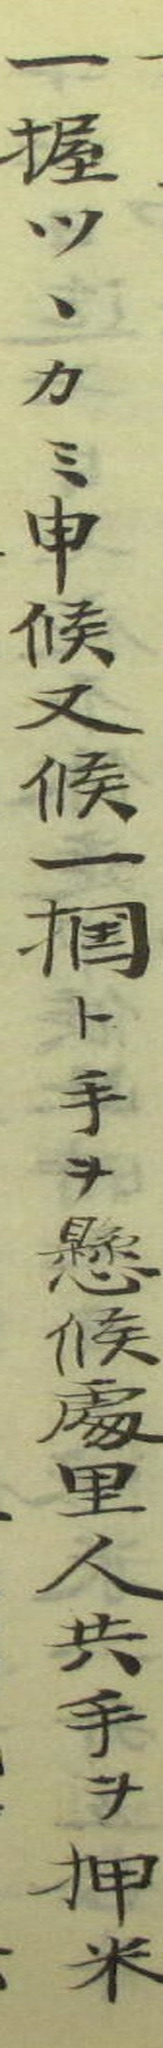一握ツヽカミ申候又候一掴ト手ヲ懸候處里人共手ヲ押米
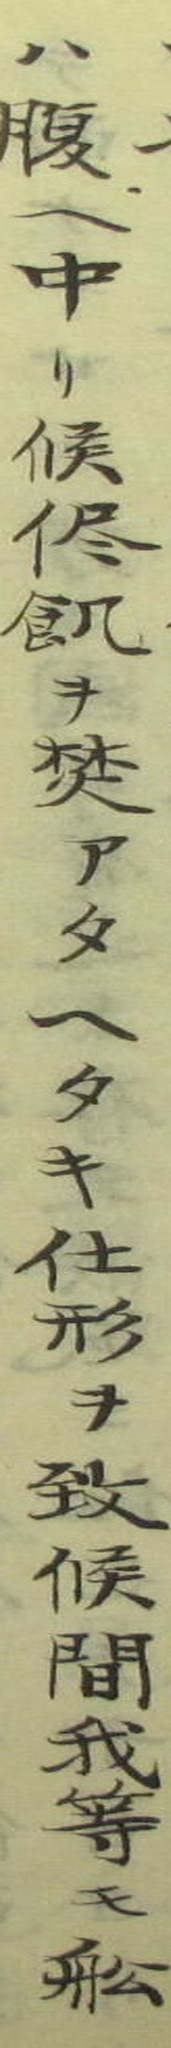ハ腹へ中リ候侭飢ヲ焚アタへタキ仕形ヲ致候間我等モ舩
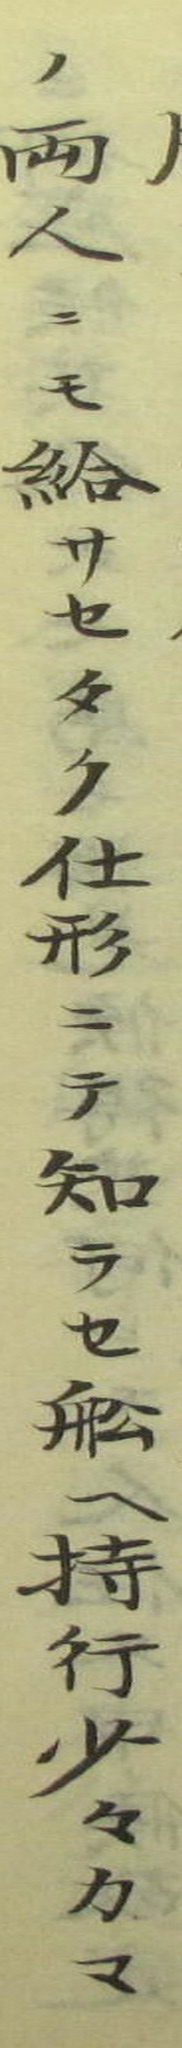ノ両人二モ給サセタク仕形ニテ知ラセ舩ヘ持行少々カマ
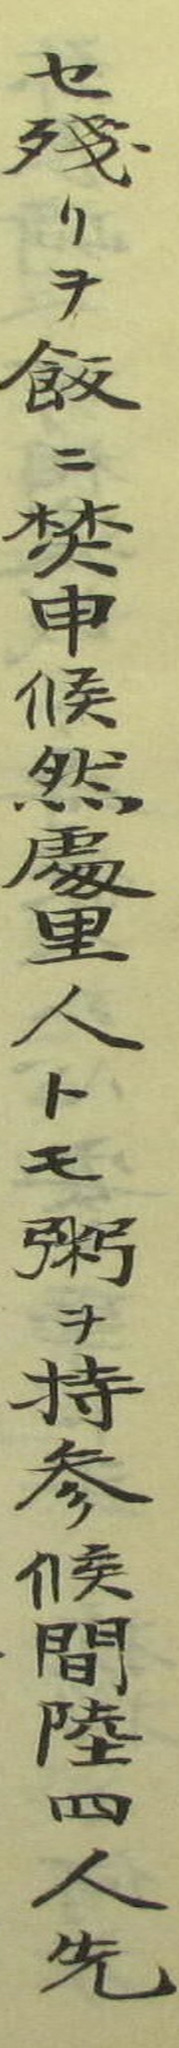セ残リヲ飯ニ焚申候然處里人トモ粥ヲ持参候間陸四人先
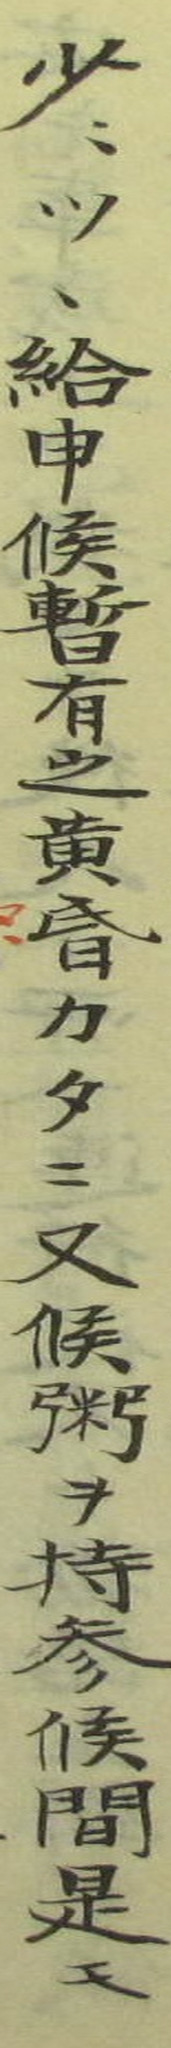少々ツヽ給申候暫有之黄昏カタニ又候粥ヲ持参候間是モ
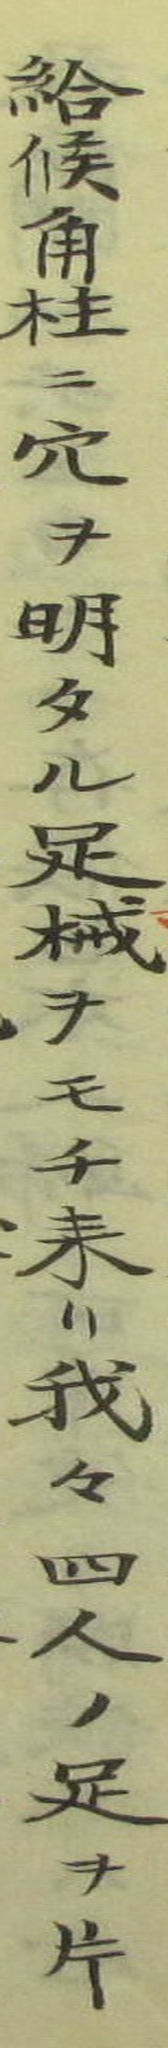給候角柱ニ穴ヲ明タル足械ヲモチ来リ我々四人ノ足ヲ片
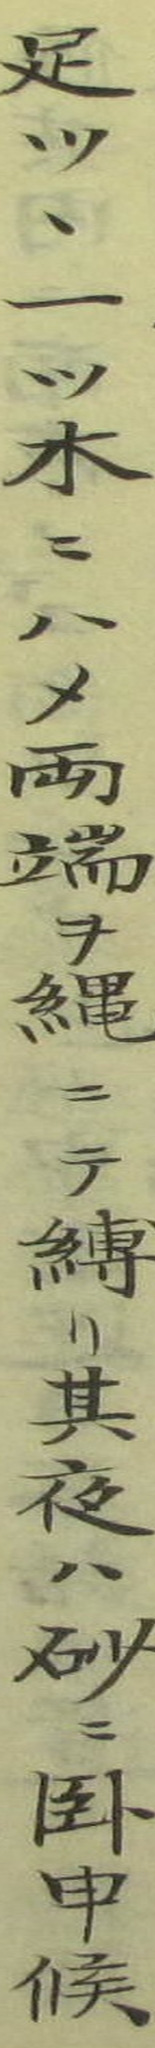足ツヽ一ツ木ニハメ両端ヲ縄ニテ縛リ其夜ハ砂ニ臥申候
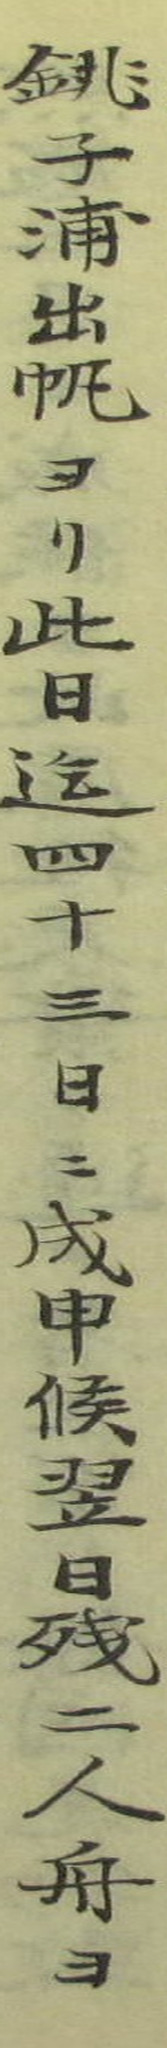銚子浦出帆ヨリ此日迄四十三日ニ成申候翌日残二人舟ヨ
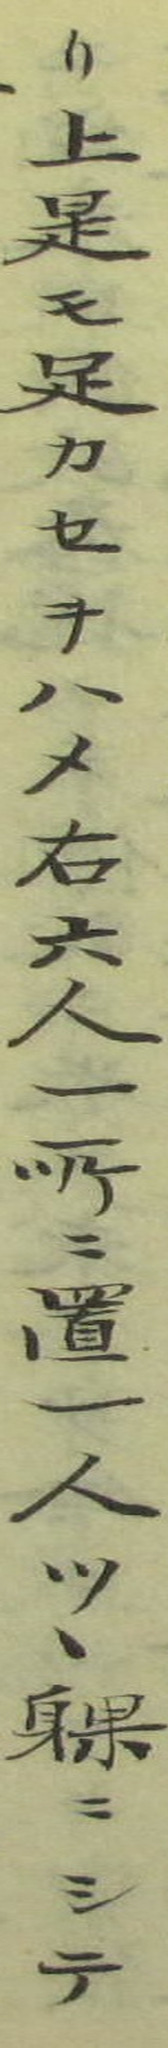リ上是モ足カセヲハメ右六人一所ニ置一人ツヽ躶ニシテ
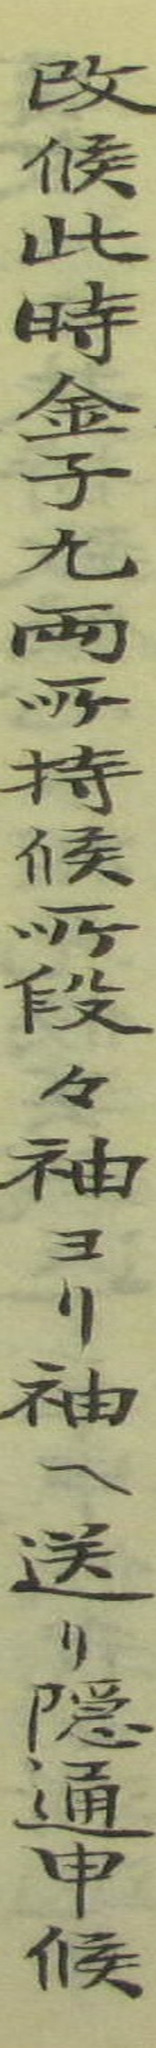改候此時金子九両所持候處段々袖ヨリ袖ヘ送リ隠通申候
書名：異国船漂着記 外二
